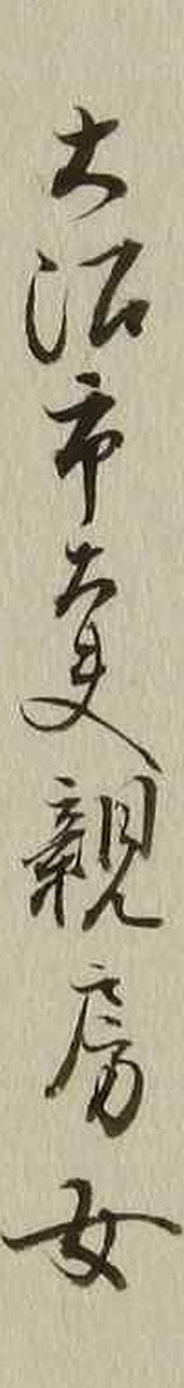妻大沼市大夫親房女
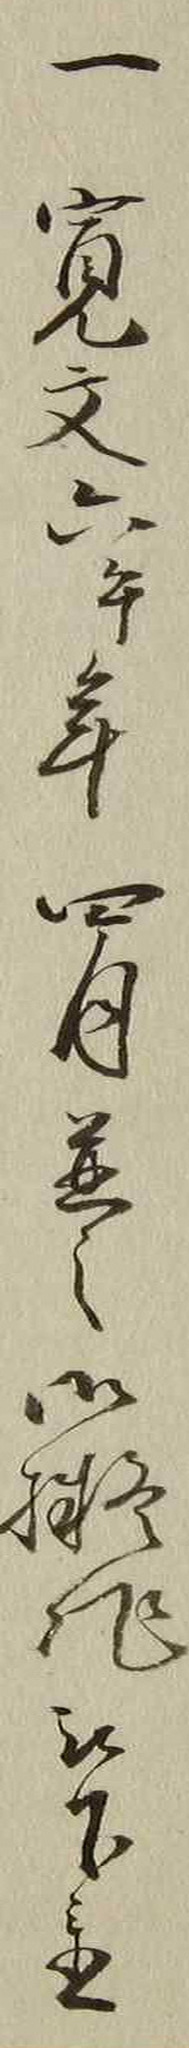一寛文六午年四月並之御擬作被下置
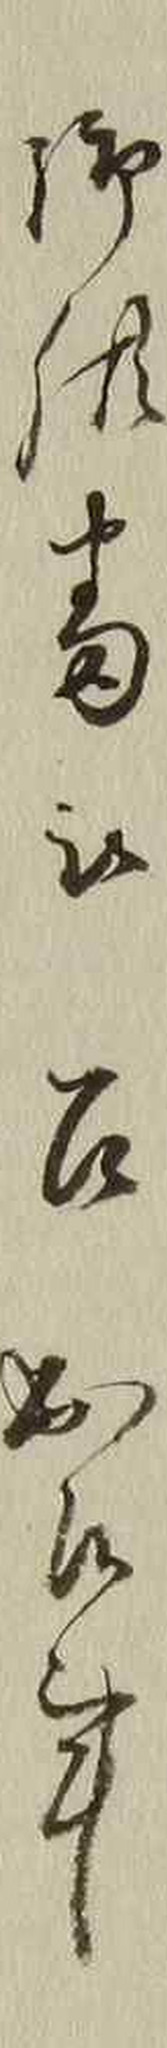御供番被召出候事
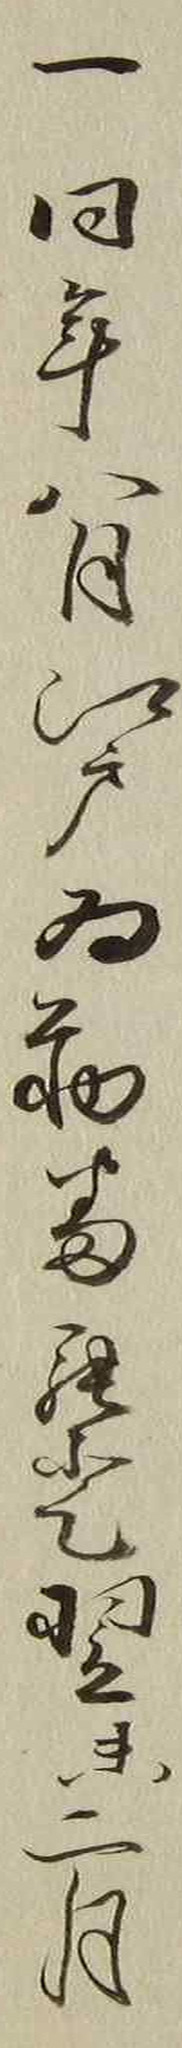一同年八月江戸為勤番罷登翌未二月
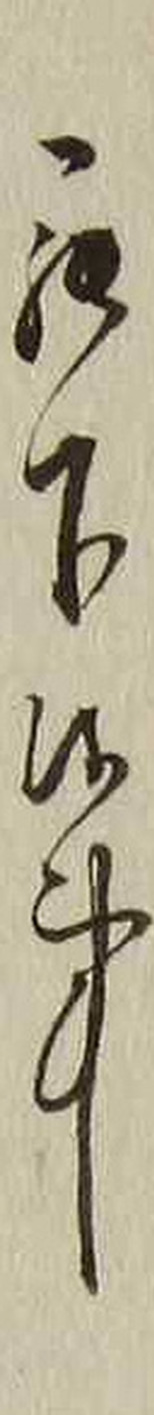罷下候事
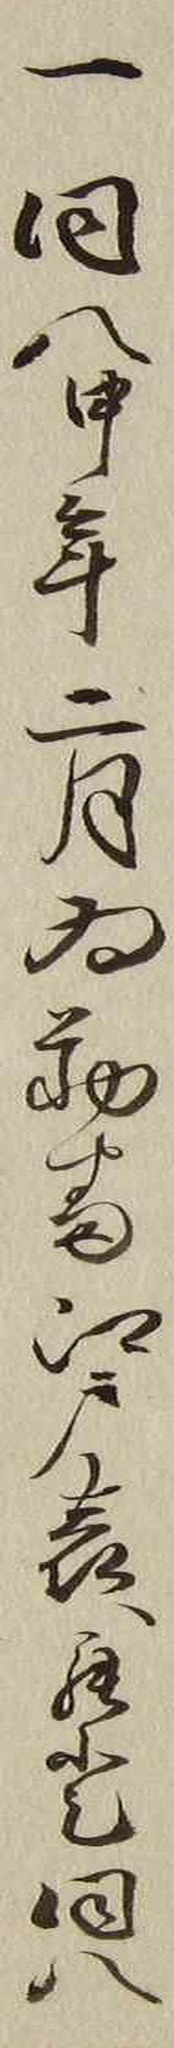一同八申年二月為勤番江戸表へ罷登同八
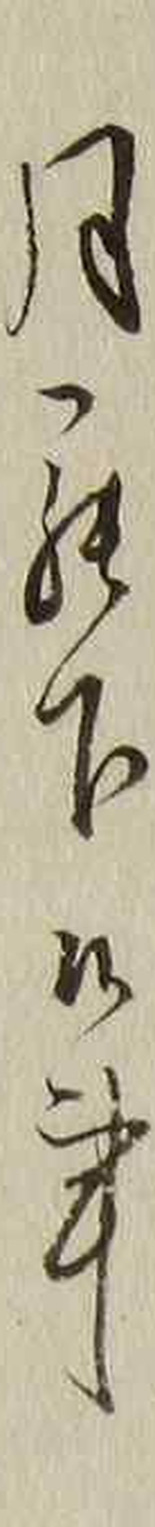月罷下候事
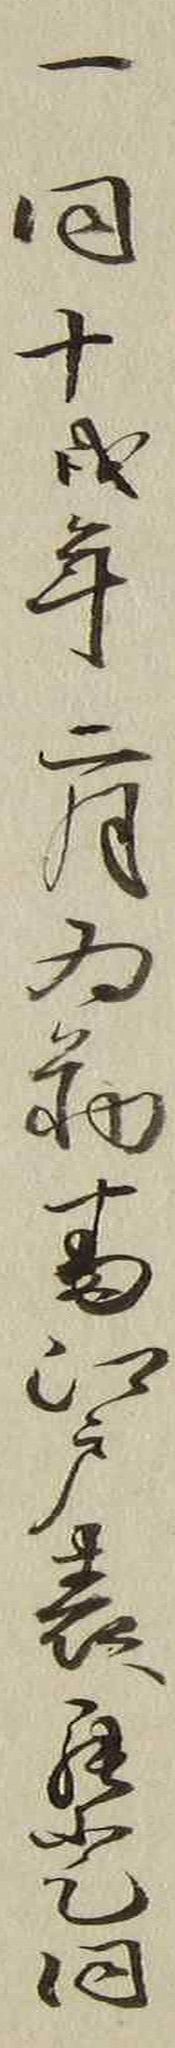一同十戌年二月為勤番江戸表へ罷登同
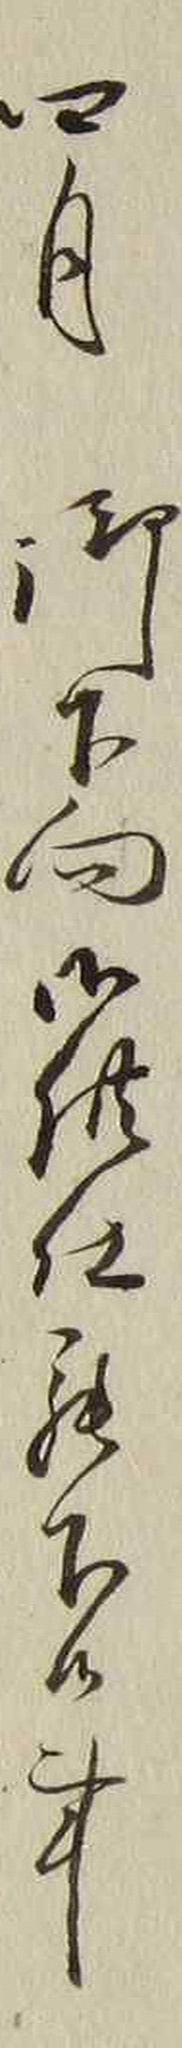四月御下向御供仕罷下候事
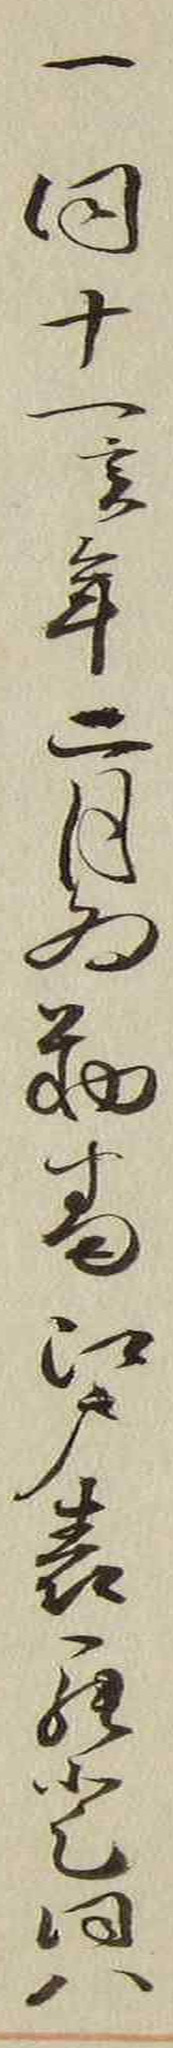一同十一亥年二月為勤番江戸表罷登同八
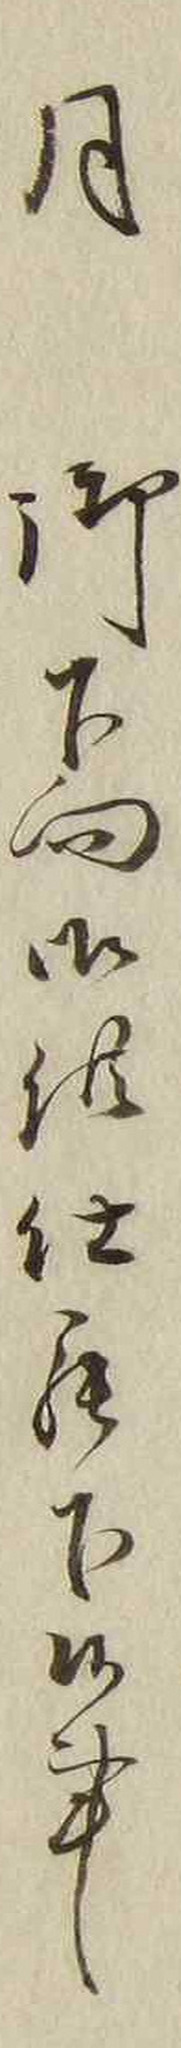月御下向御供仕罷下候事

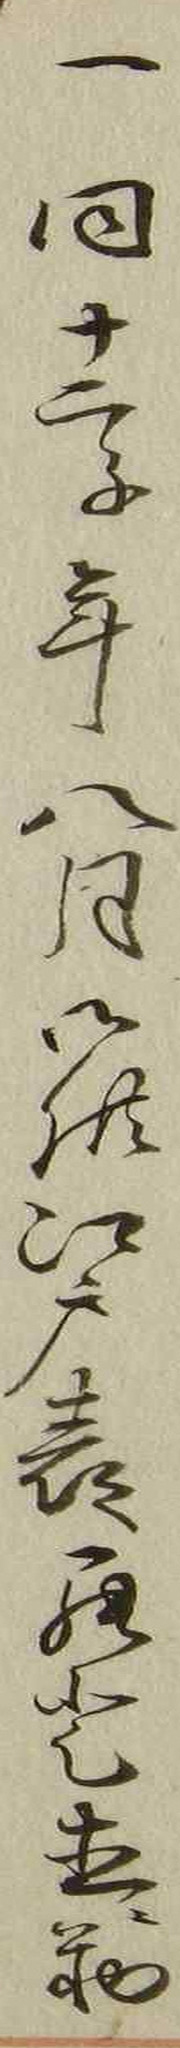一同十二子年八月御供江戸表へ罷登直ニ勤
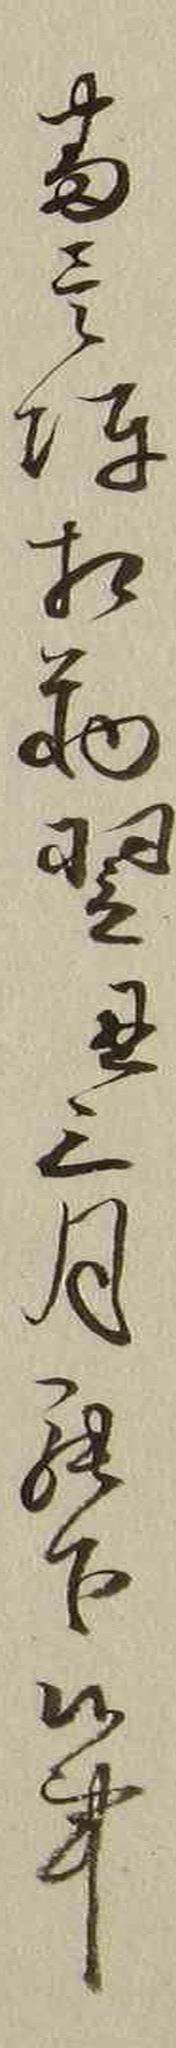番壱陣相勤翌丑三月罷下候事
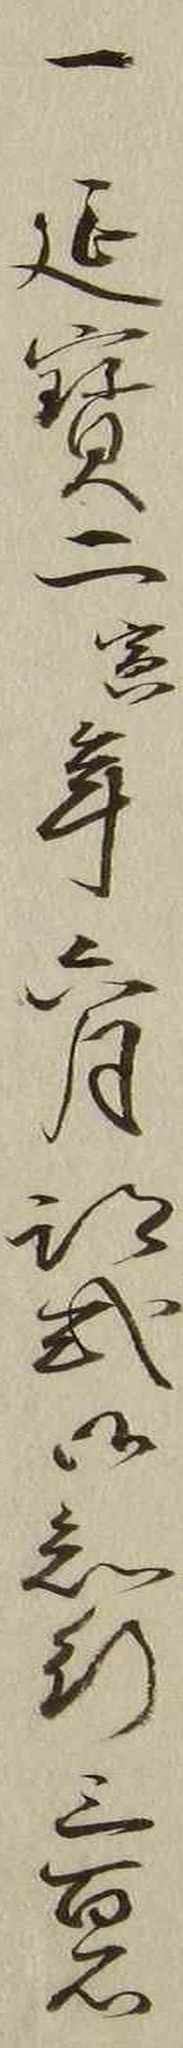一延宝二寅年六月跡式御知行三百石
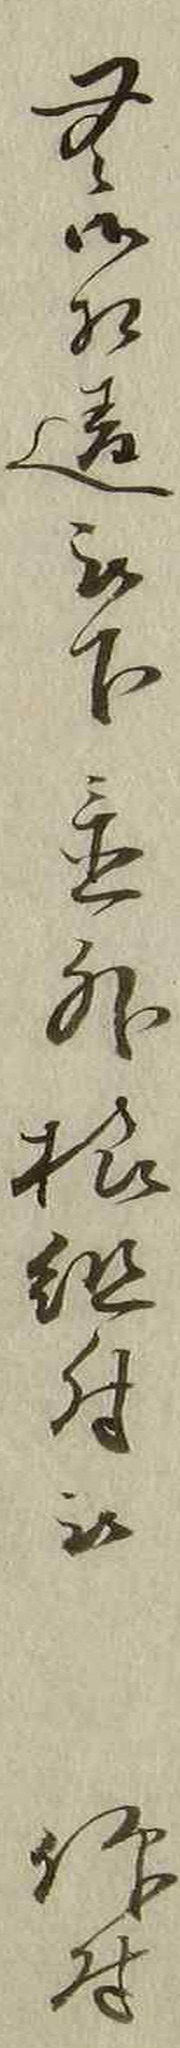無御相違被下置外様組付被仰付
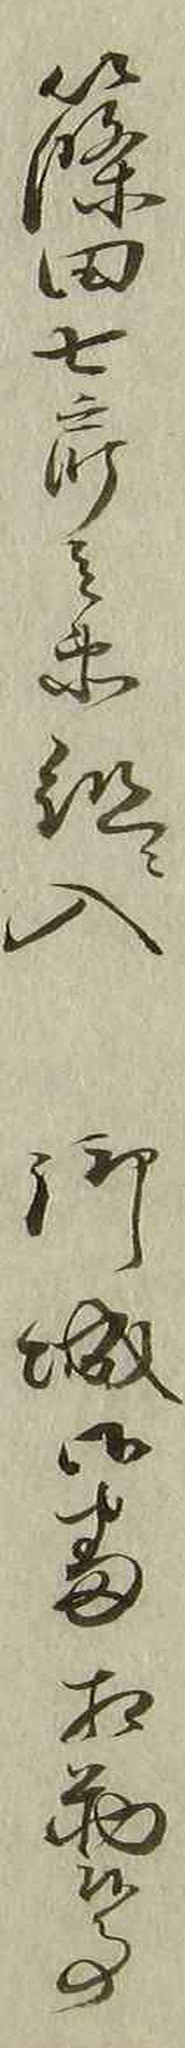篠田七郎兵衛組ニ入御城御番相勤候事
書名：諸士系譜　巻之122　よ之部5
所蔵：会津若松市立会津図書館
